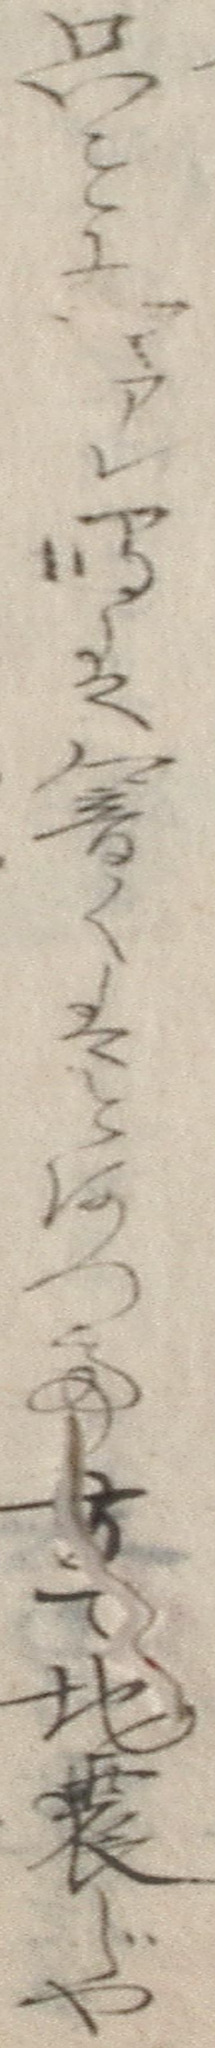只こと六アレ鳴は響くはとあつて地震じゃ
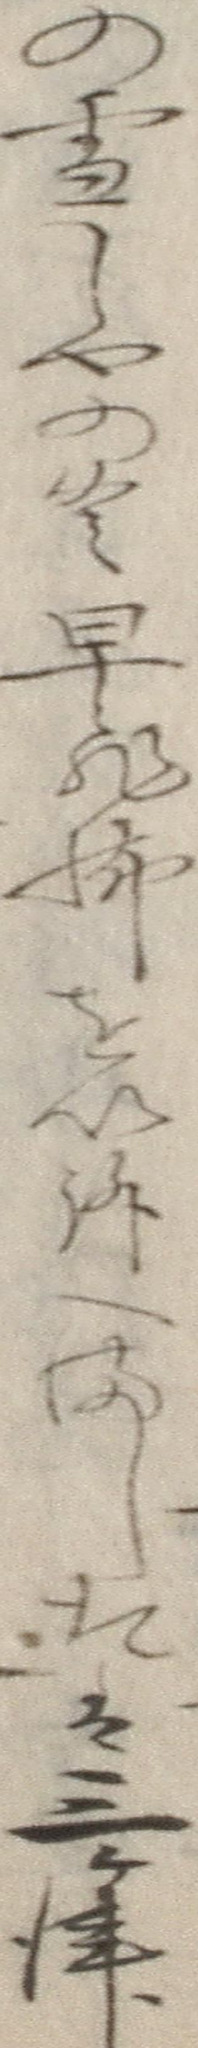の雷しゃのと早飛脚を以訴へましたは三ケ津
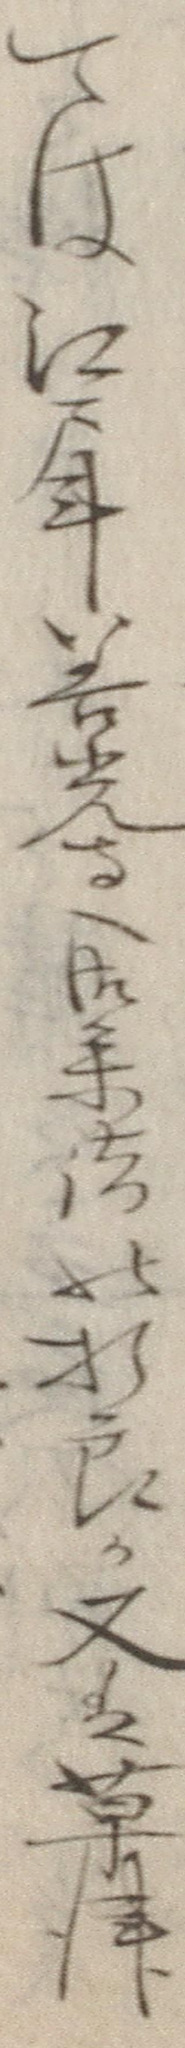ては江戸斗善光寺へ御参詣の折節か又は草津
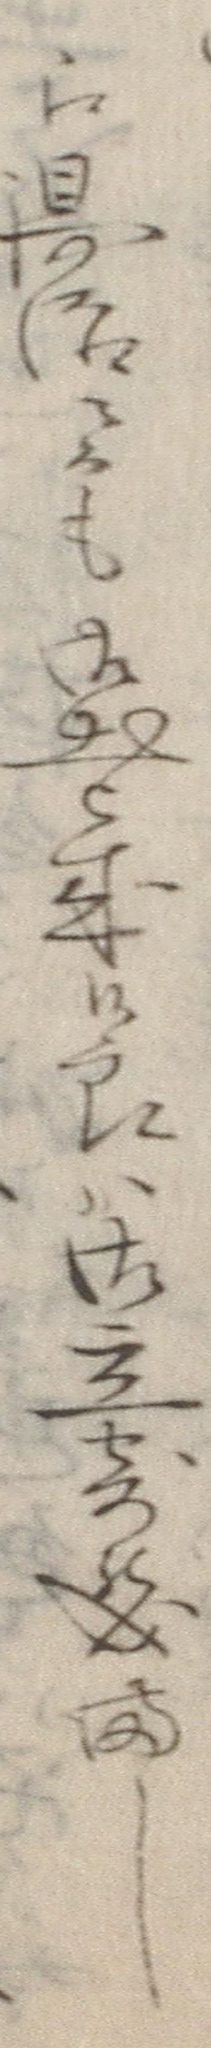え湯治ニ而も御出被成候節は御立寄被成まし
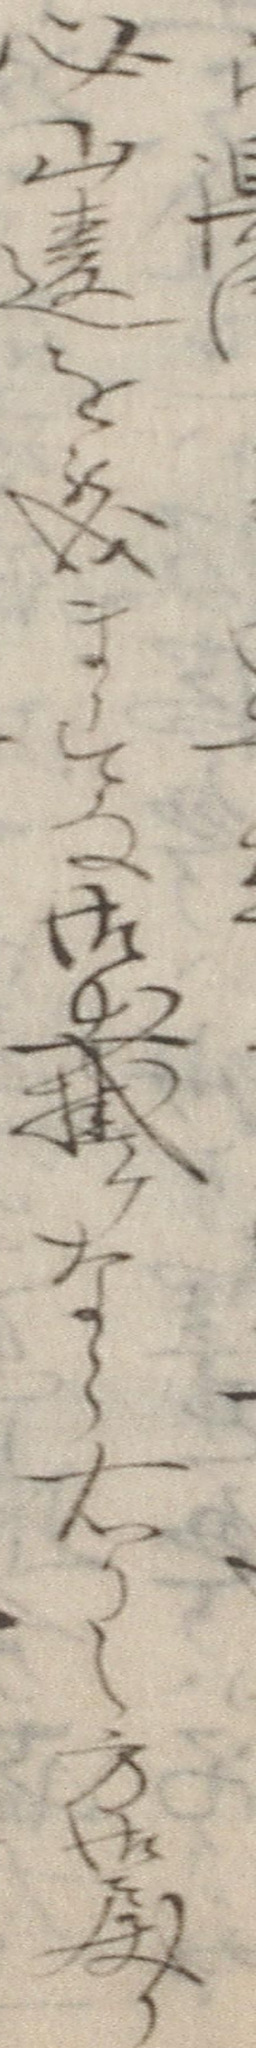必山違を被成ますな御出掛ケなら右り之方御戻り
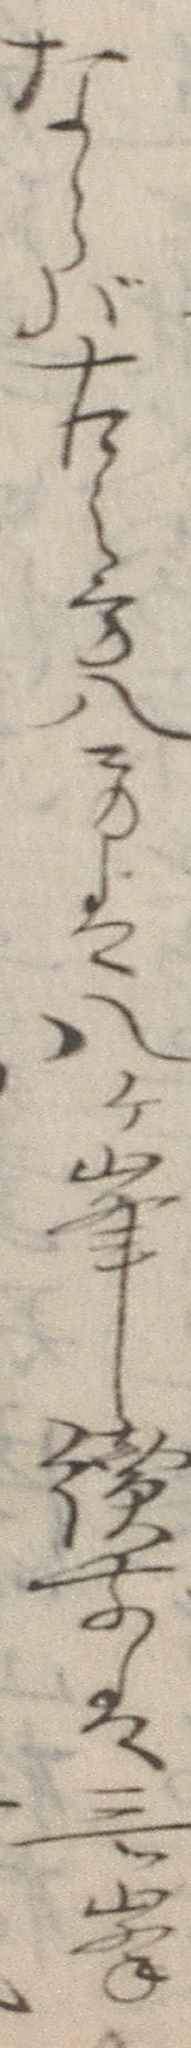ならば右之方八方は八ケ峯続前は三ツ峯
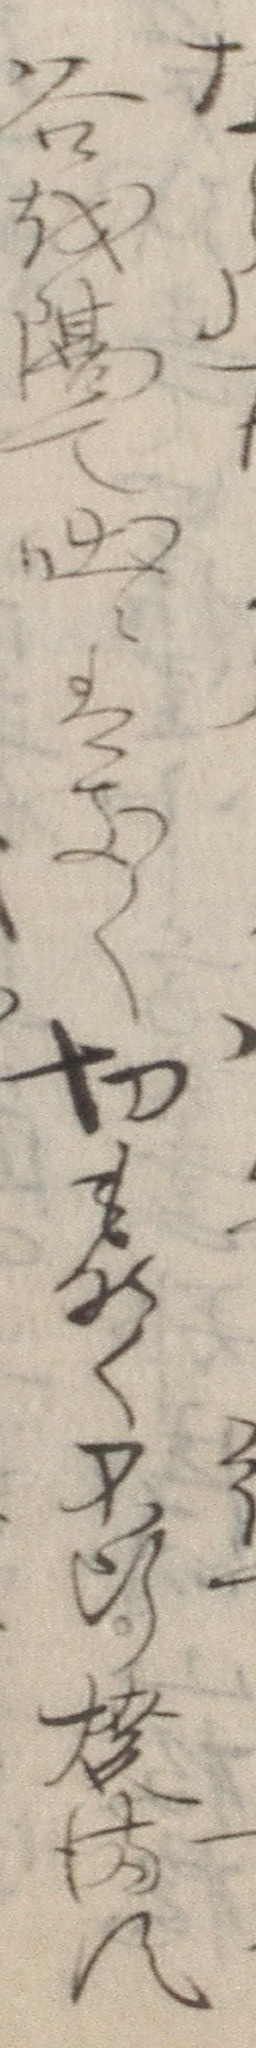谷を隔て咄ニはきく切もなく不断焼ます
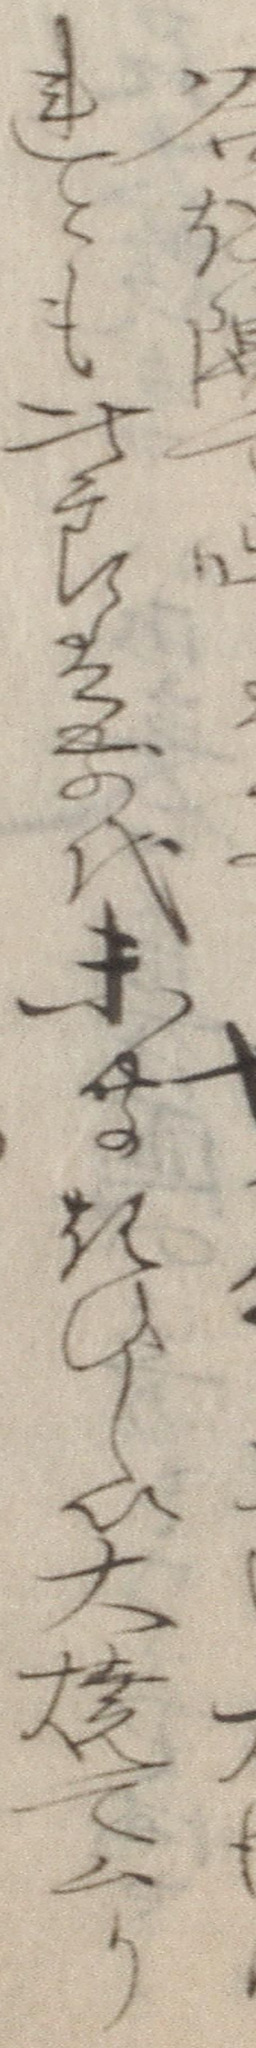れとも此節は前代未聞きひしい大焼て厶り
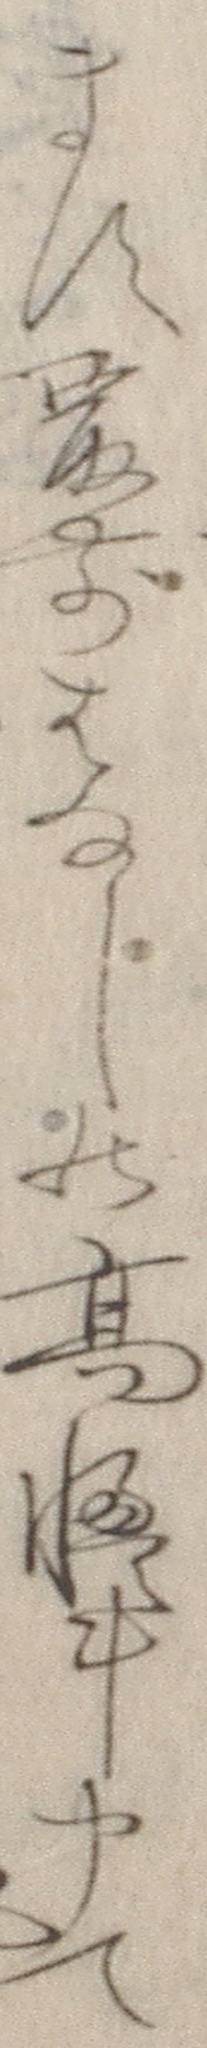ます最前はなしの高慢斗申て
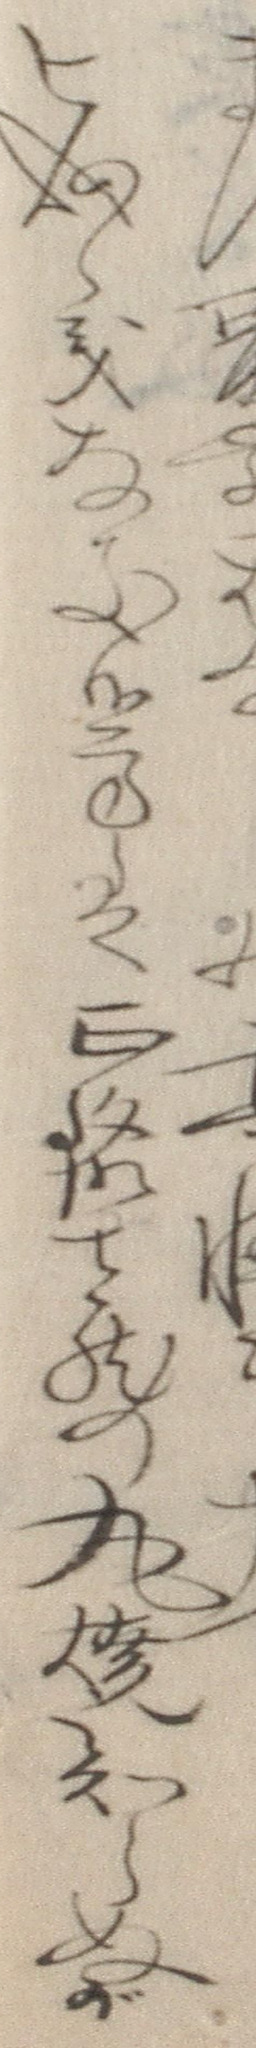被成候義なき候ては正銘は罷入丸焼知らぬが
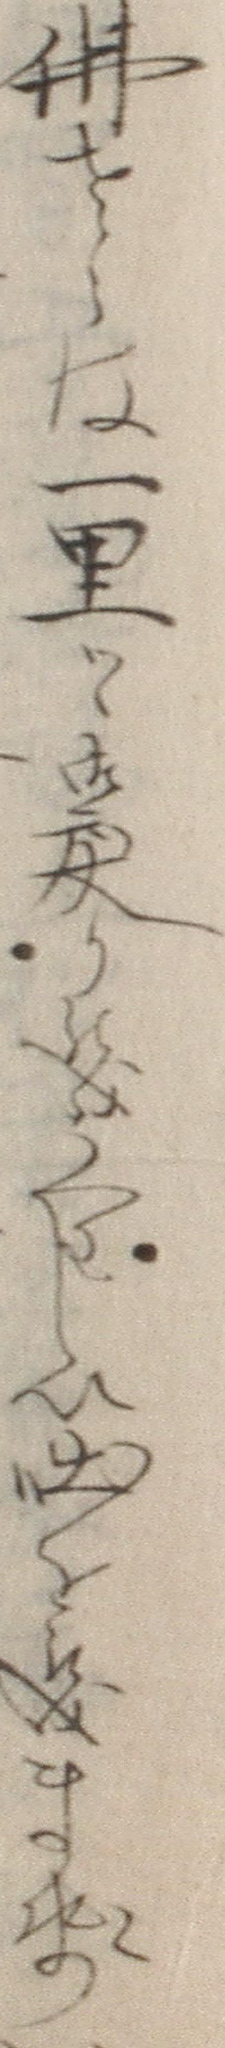仏さらは一里ツゝ御戻り被成くわしい咄を被成まい
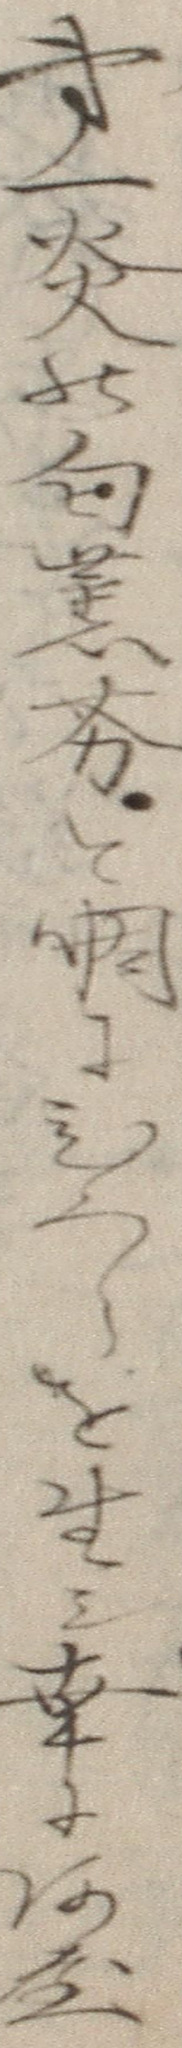第一炎の匂薫芬と烟にひつしを生シ幸に河屋
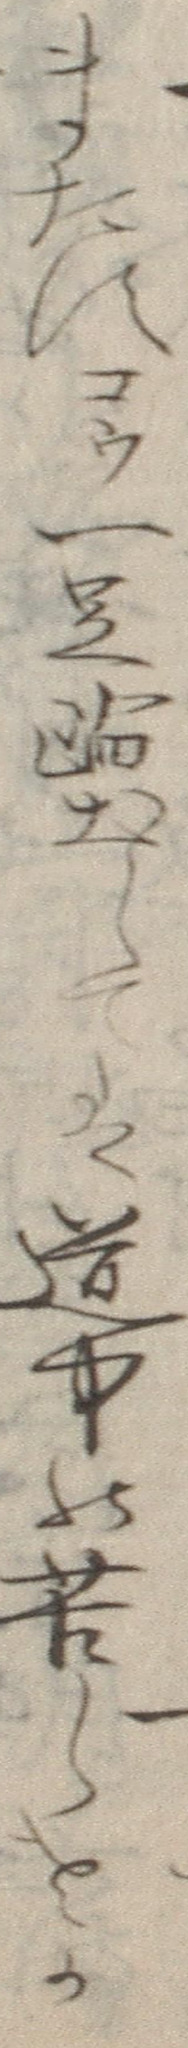またすコウ一足踏出しては道中の苦しさか
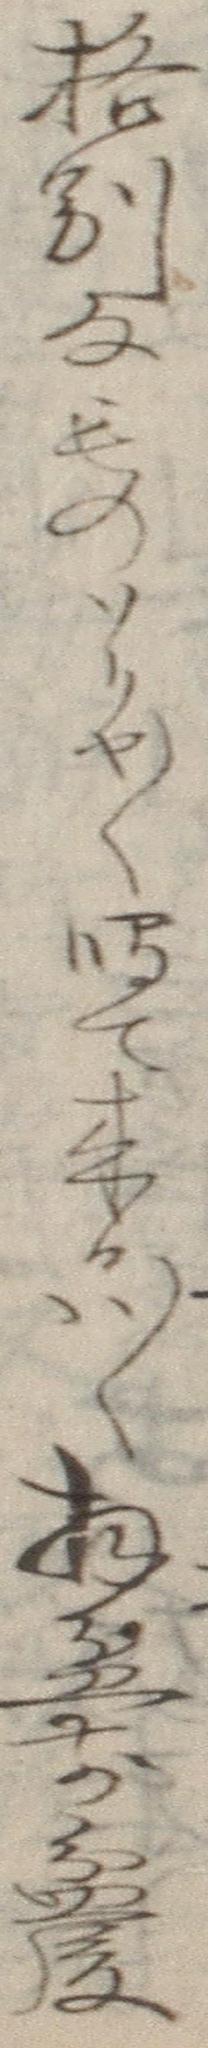格別なものソリャ〳〵鳴て来るは〳〵拝盆前盆後
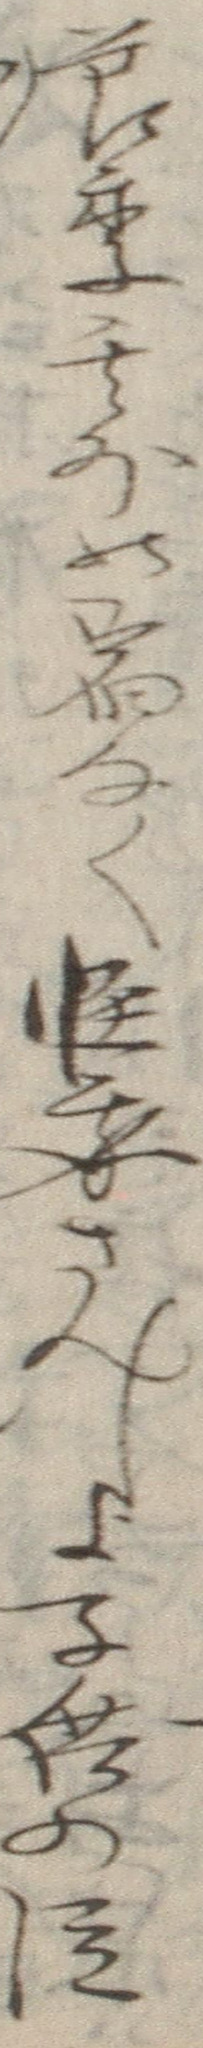節季其外の宿なく怪我さんしょ子供の泣
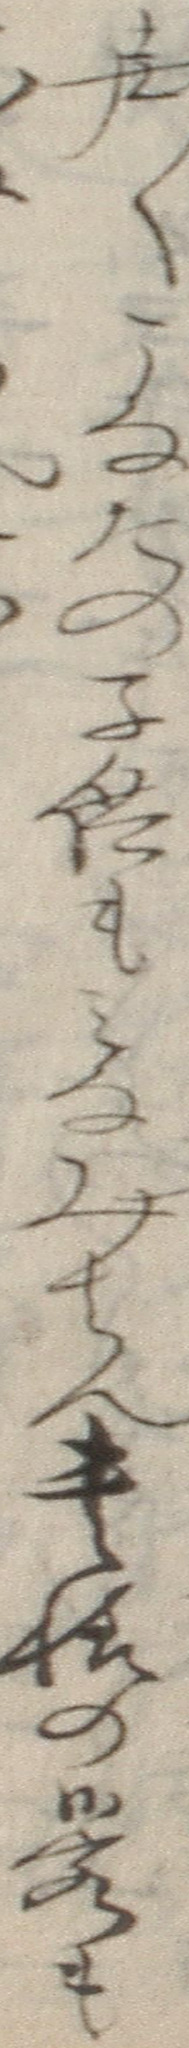声〳〵こなたの子供もみなみちん貴様の御客も
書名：[諸国災害記録]
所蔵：東京大学地震研究所図書室 Earthquake Research Institute Library, The University of Tokyo, JAPAN
